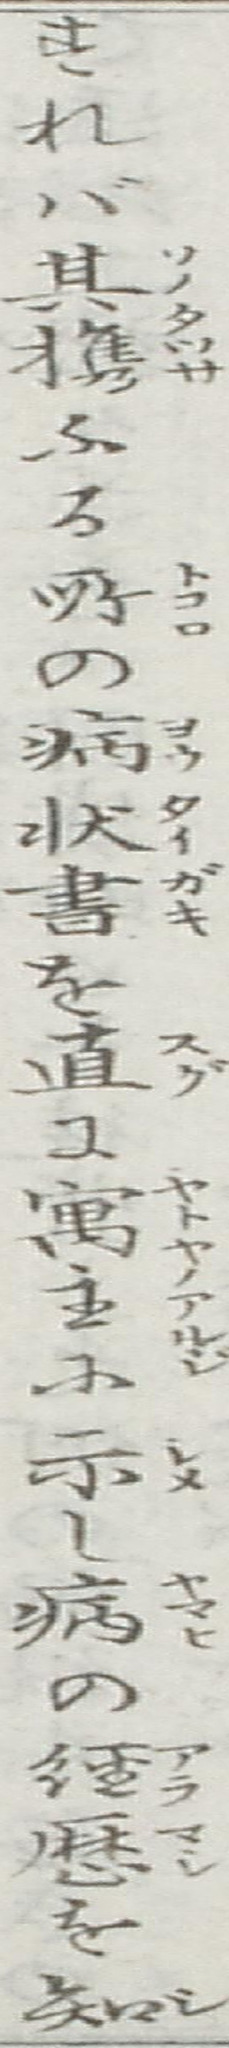すれば其携ふる所の病状書を直に寓主に示し病の経歴を知
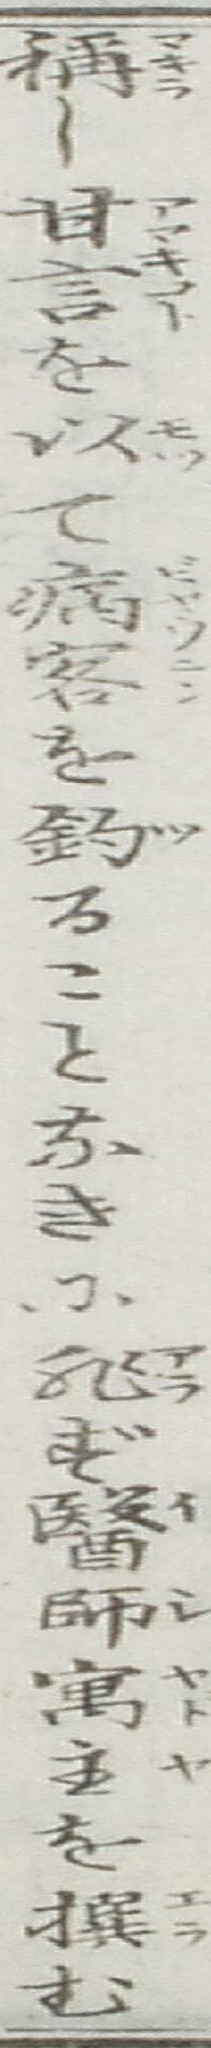称し甘言を以て病客を釣ることなきに非ず医師寓主を撰む
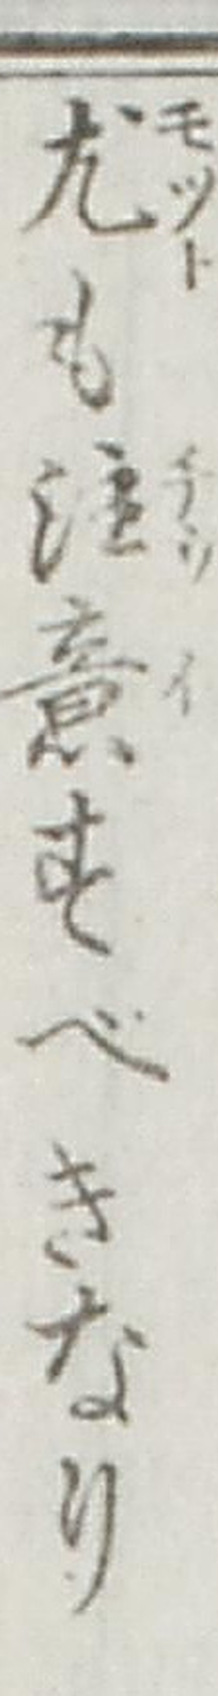尤も注意すべきなり
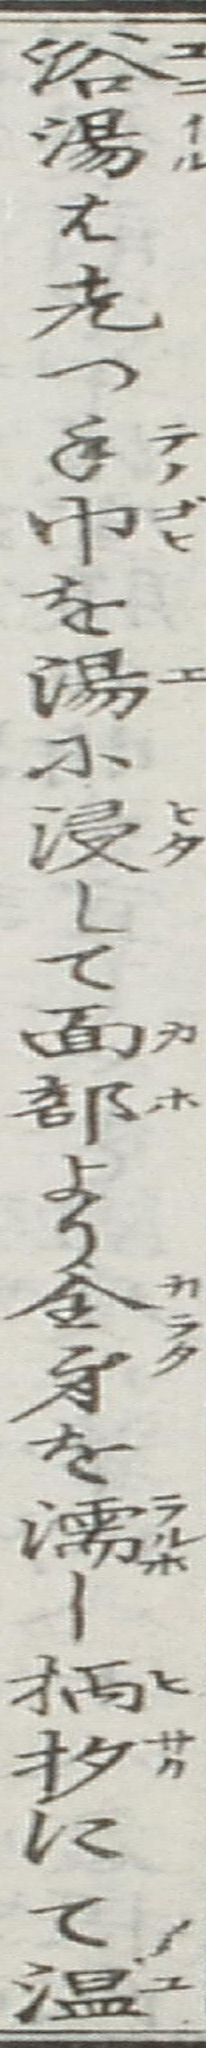浴場は先つ手巾を湯に浸して面部より全身を濡し柄杓にて温
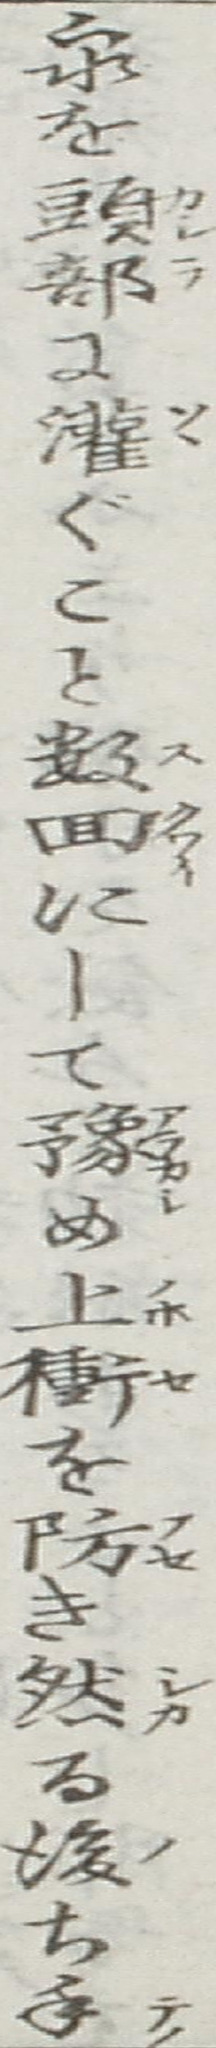泉を頭部に灌ぐこと数回にして予め上衝を防き然る後ち手
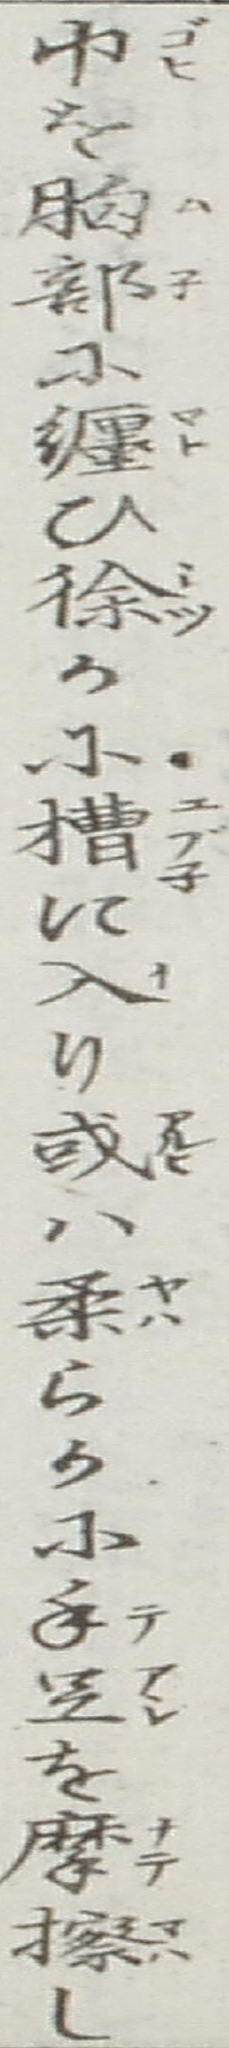巾を胸部に纏ひ徐かに槽に入り或は柔らかに手足を摩擦し
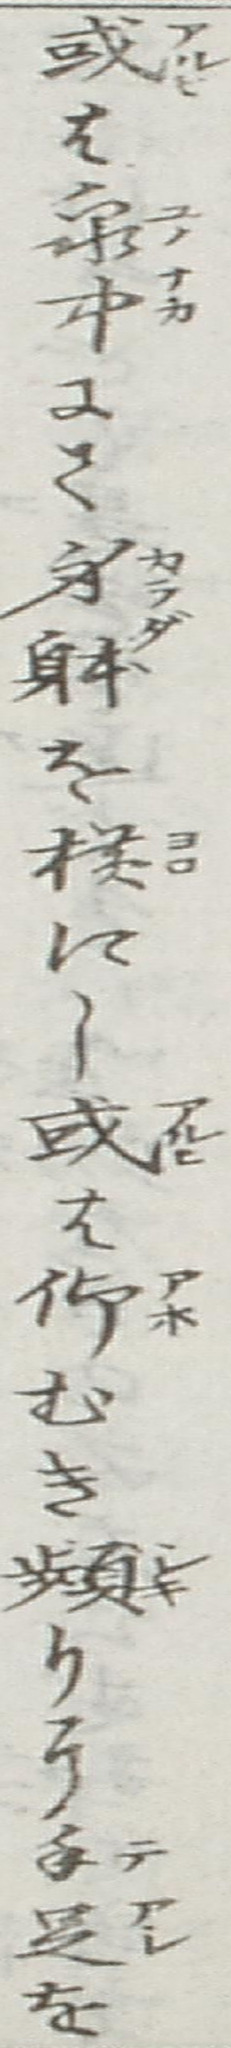或は泉中にて身体を横にし或は仰むき頻りに手足を
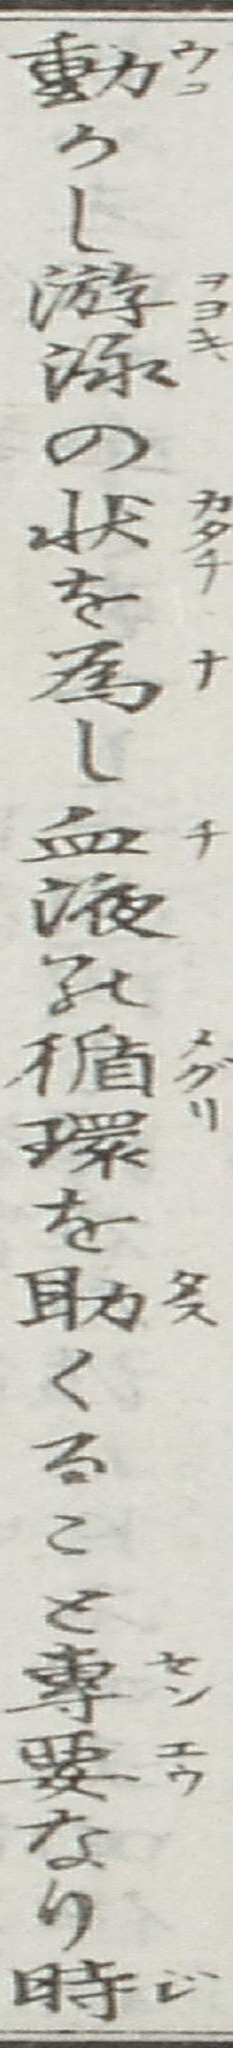動かし游泳の状を為し血液の循環を助くること専要なり時
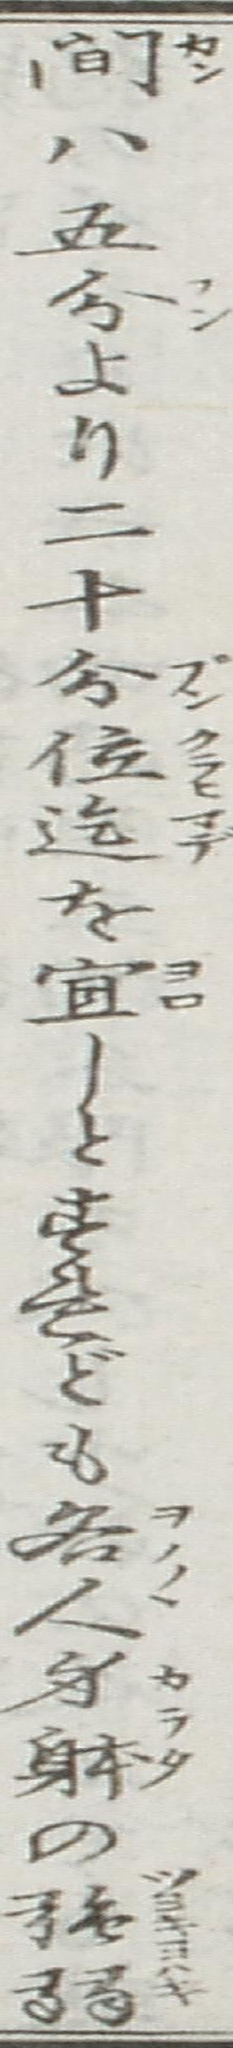間は五分より二十分位迄を宜しとすれども各人身体の強弱
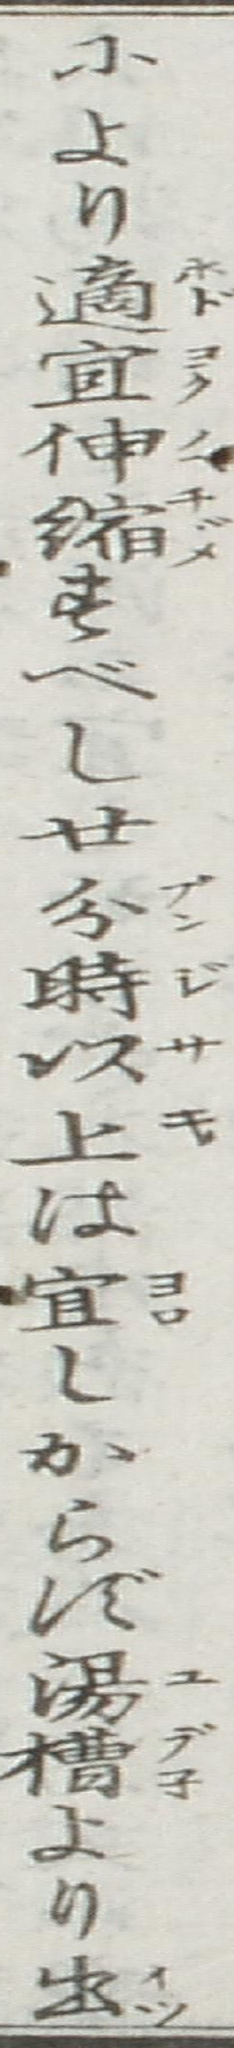により適宜伸縮すべし廿分時以上は宜しからず湯槽より出
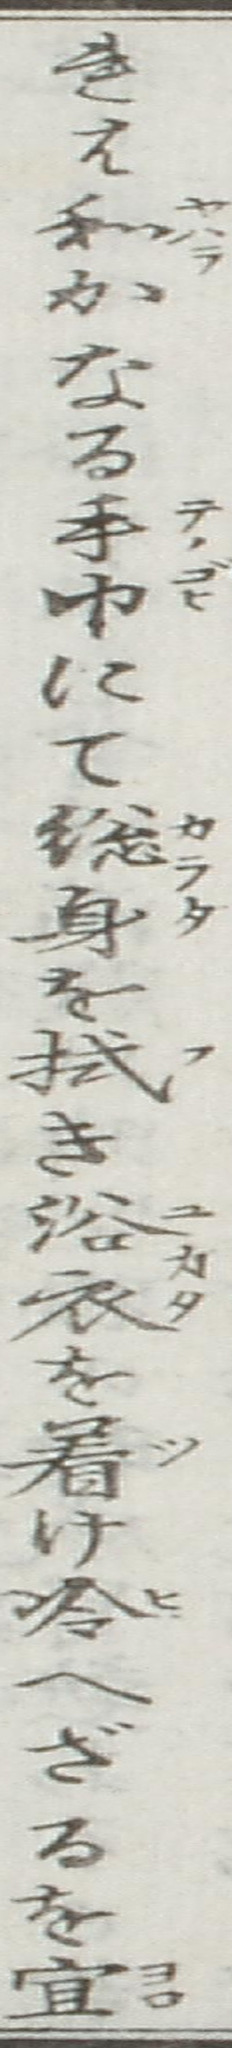れは和かなる手巾にて総身を拭き浴衣を着け冷へざるを宜
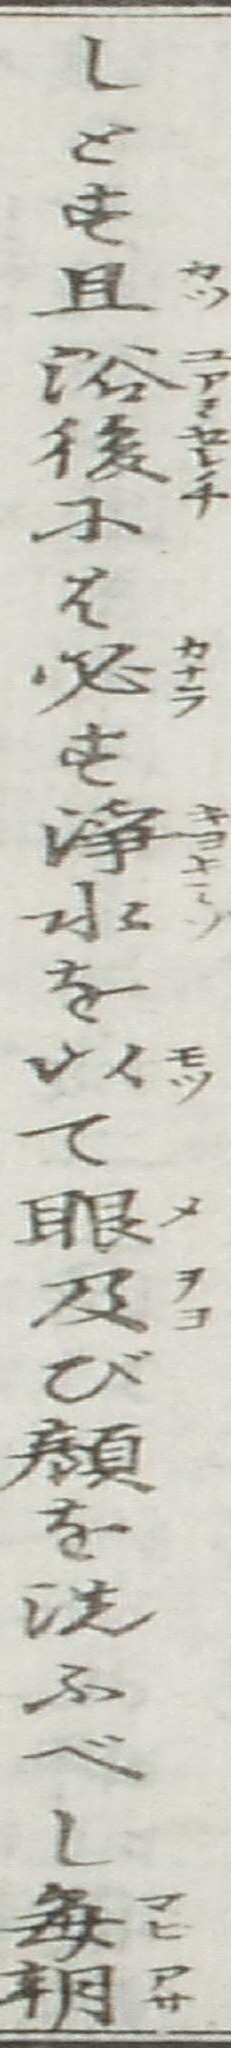しとす且浴後には必浄水を以て眼及び顔を洗ふべし毎朝
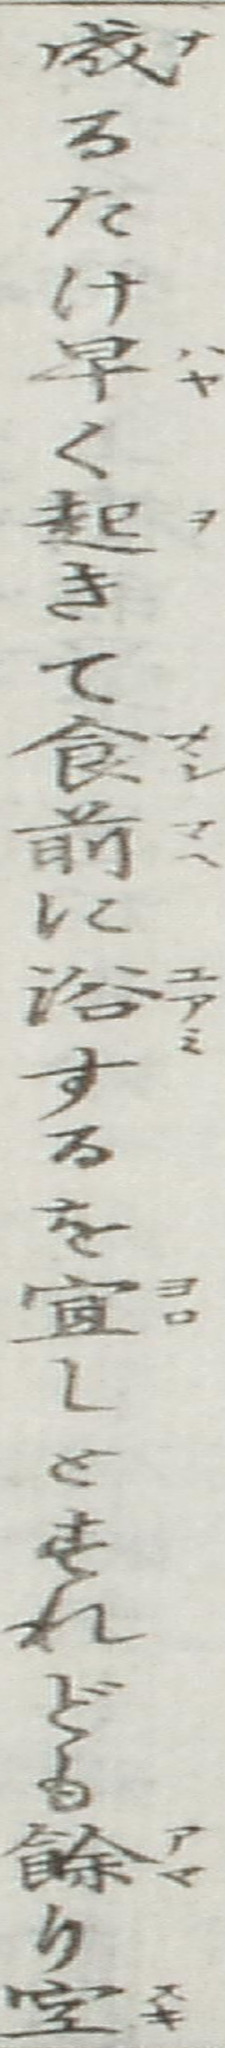成るたけ早く起きて食前に浴するを宜しとすれども余り空

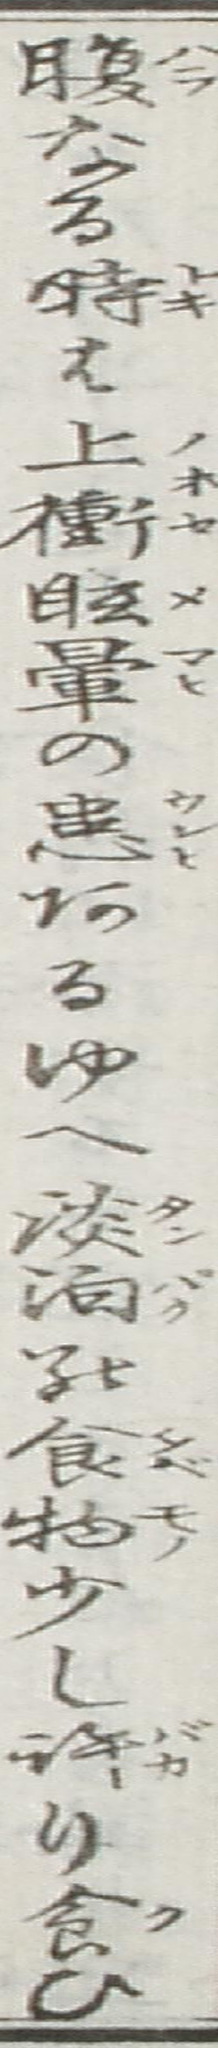腹なる時は上衝眩暈の患あるゆへ淡泊の食物少し許食ひ
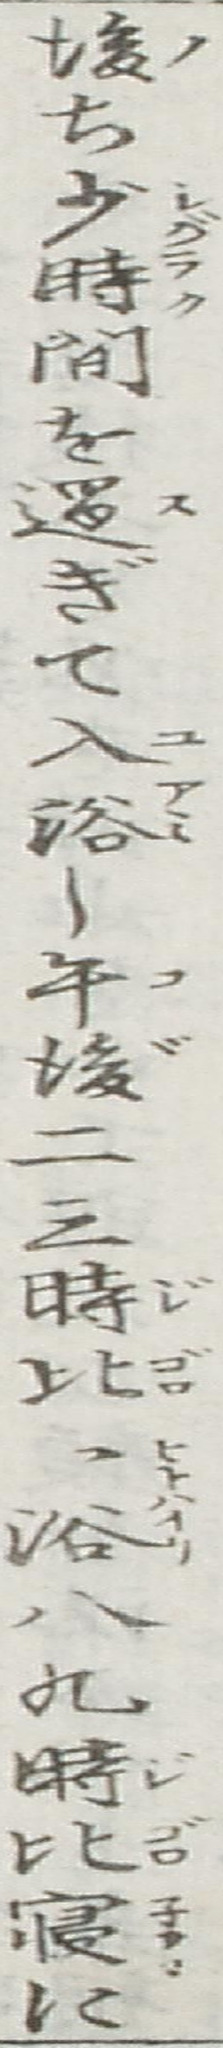後ち少時間を過ぎて入浴し午後二三時比一浴八九時比寝に
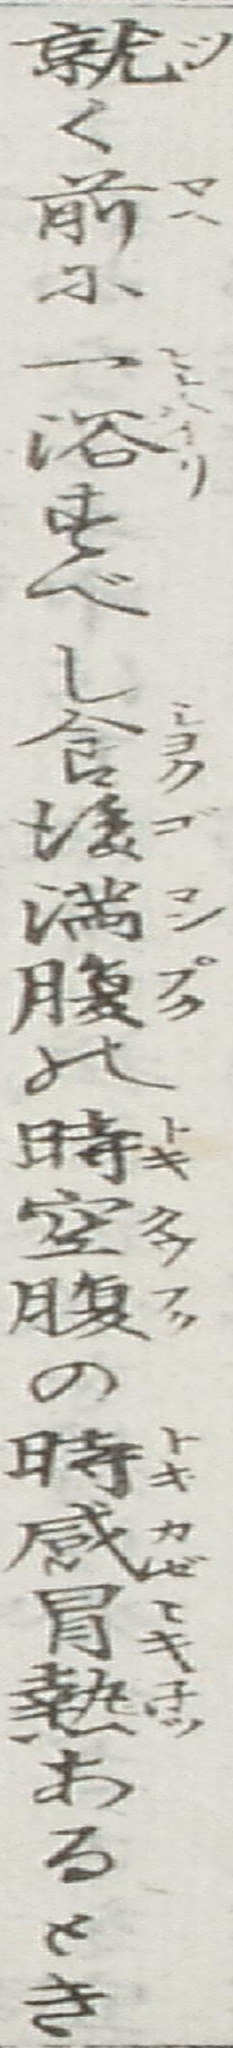就く前に一浴すべし食後満腹の時空腹の時感冒熱あるとき
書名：草津温泉誌　全
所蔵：東京大学地震研究所図書室 Earthquake Research Institute Library, The University of Tokyo, JAPAN
